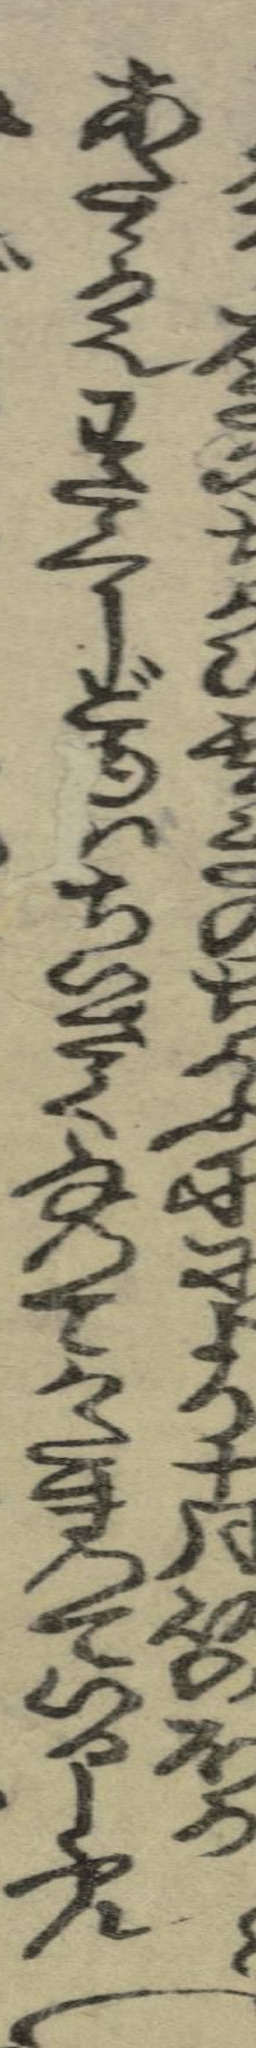あたゝか也わたくしどもはちいさくなつてかたまつているしやん
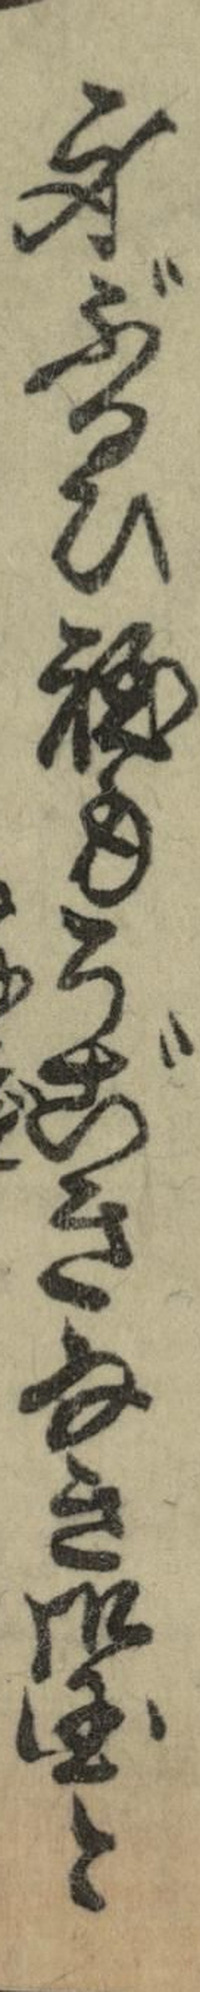身ぶるひ程もうごきなき御国と
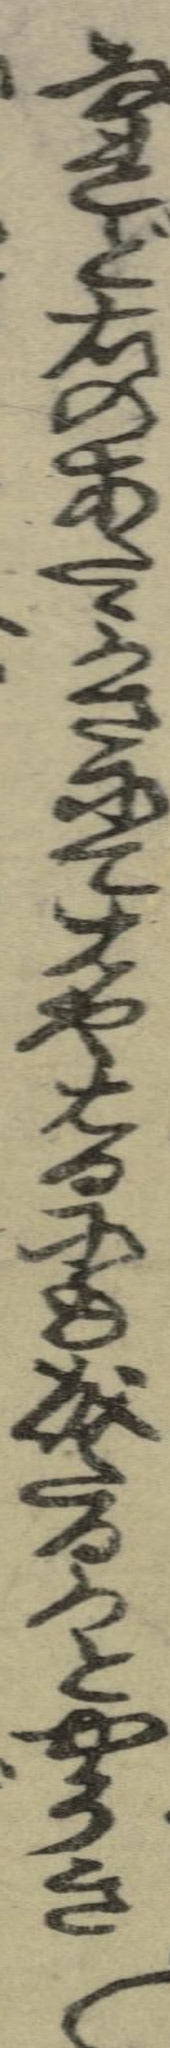なれど右のあたゝかさにてはやはるにも成たるかとやうき
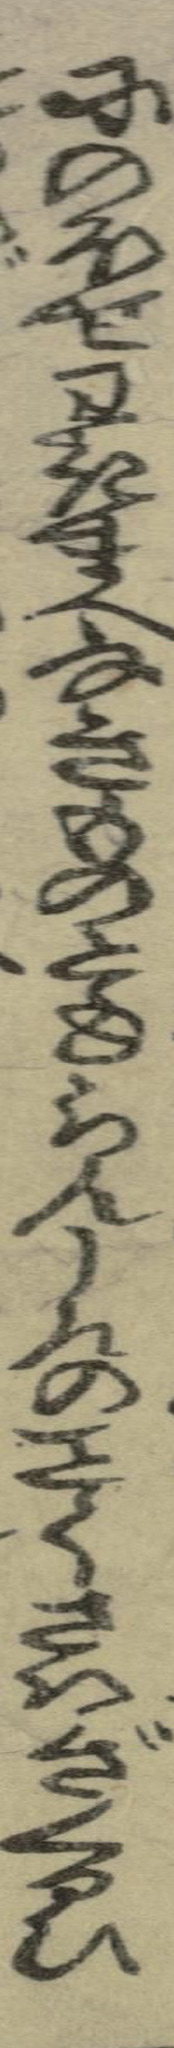にのほせわきまへなきものともらんしんのことくさはぎくるひ
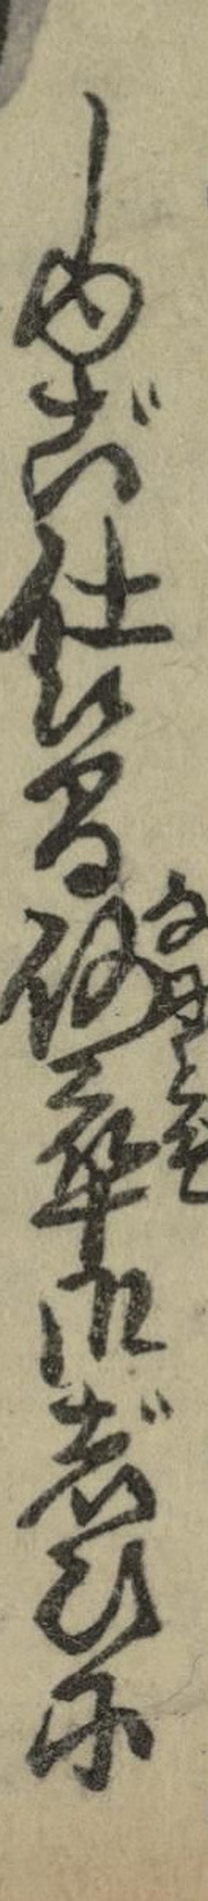しゆご仕候間何卒御じひに
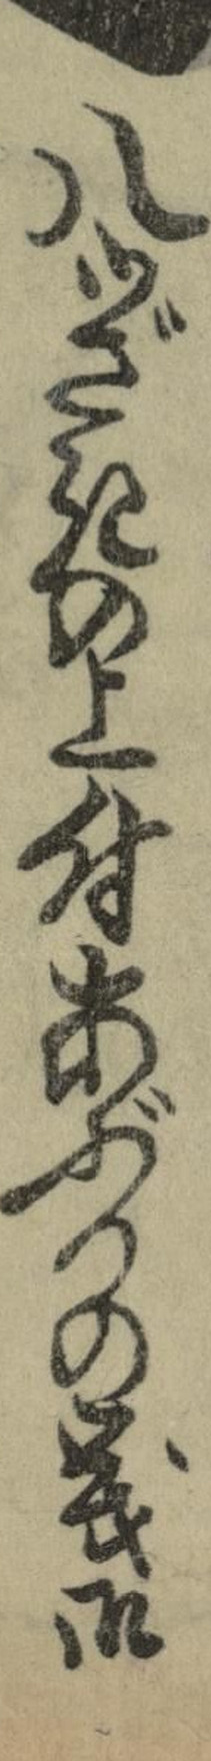八ツざきの上付あぶりの義御
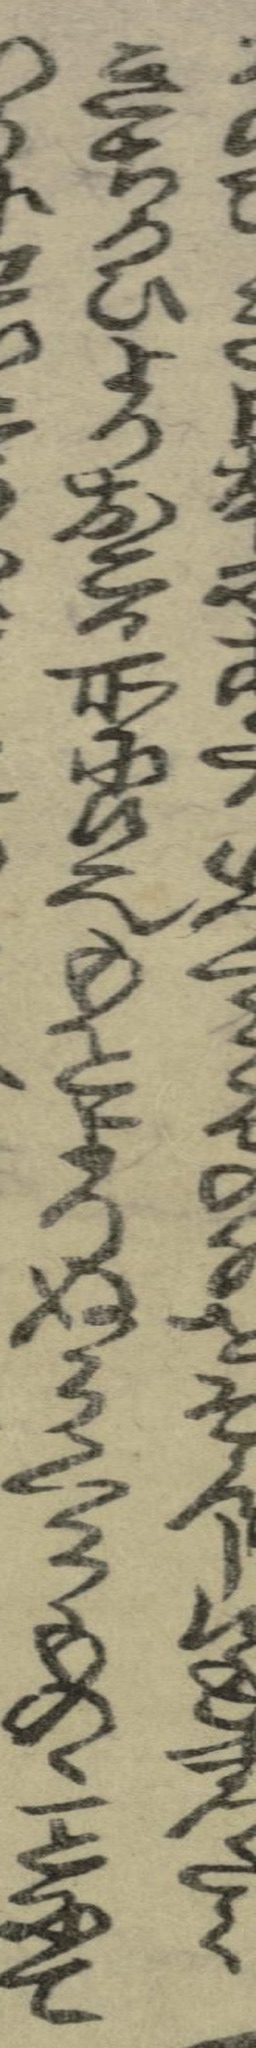きちかひよりおこる所に候也もとよりぬらくらものゝことにて
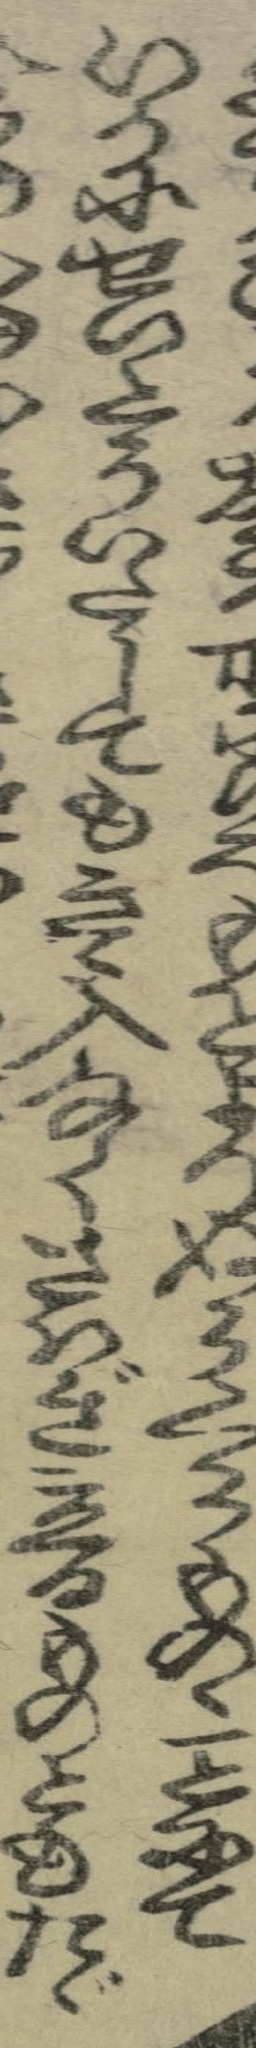いかにせいとういたしてもきゝ入なくさはぎ立るものともたゞ
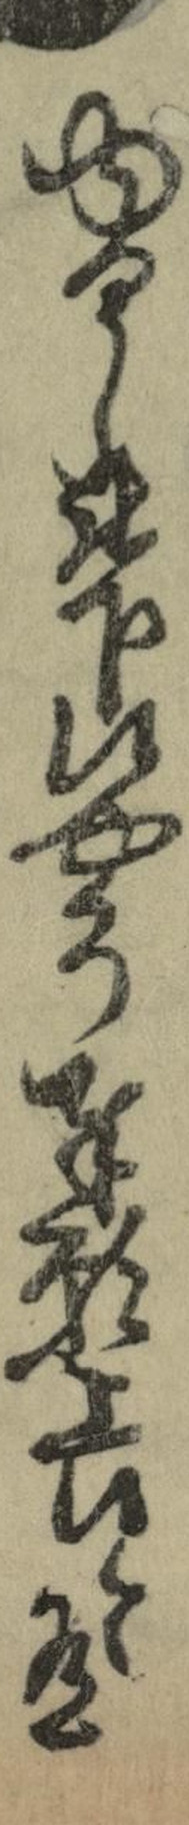ゆるし被下候やう奉願上候て有
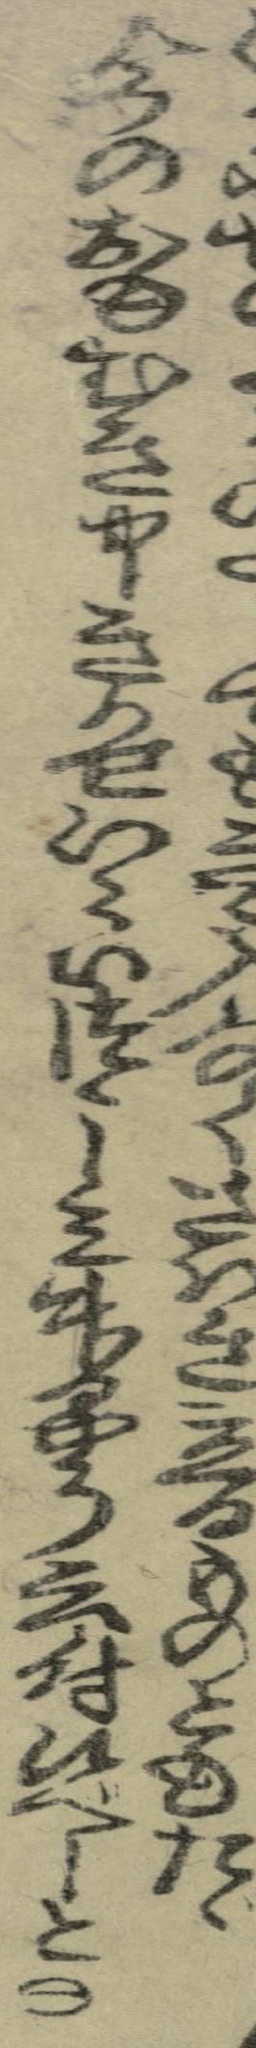今のおもむき申きかせつゝつつしみ奉るやう云付候べしと㊀
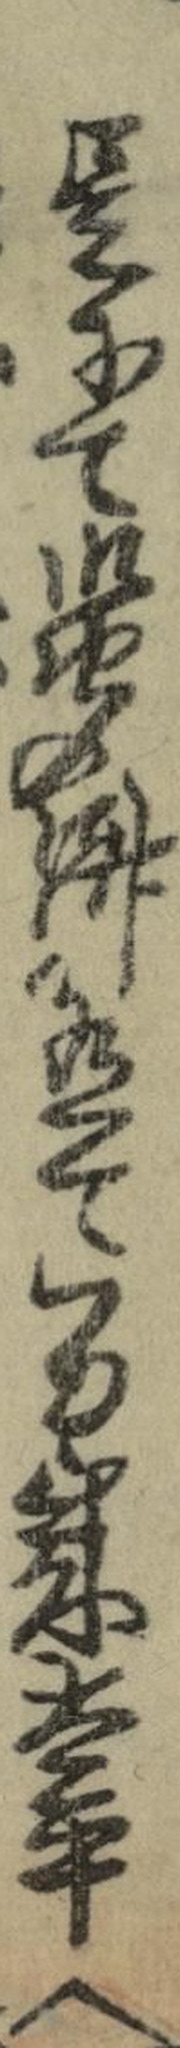是にて御聞済有て万歳太平
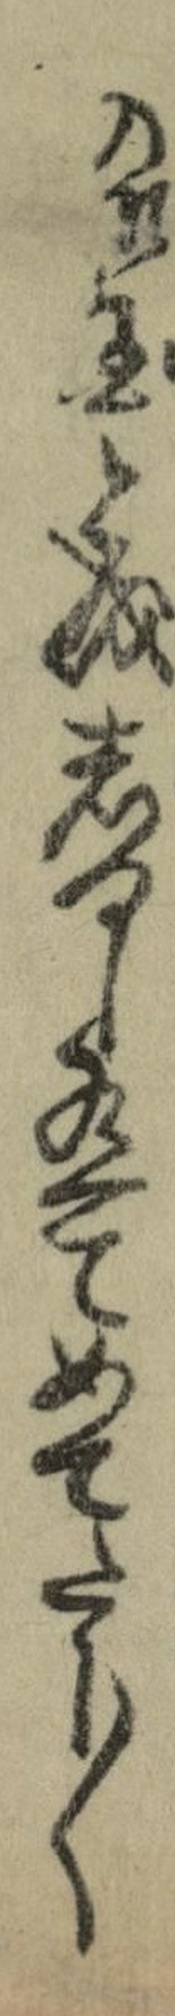の御国と成しるし有てめてたし〳〵
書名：鹿島大神宮託曰
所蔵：東京大学地震研究所図書室 Earthquake Research Institute Library, The University of Tokyo, JAPAN
